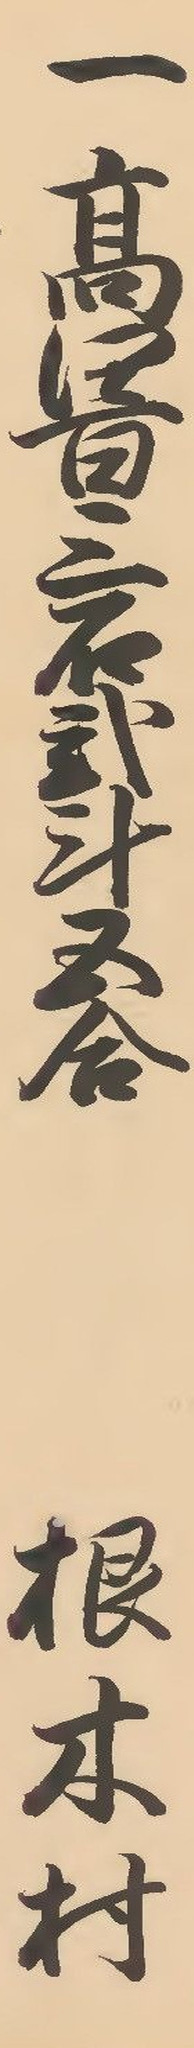一髙四百三石弐斗五合根木村

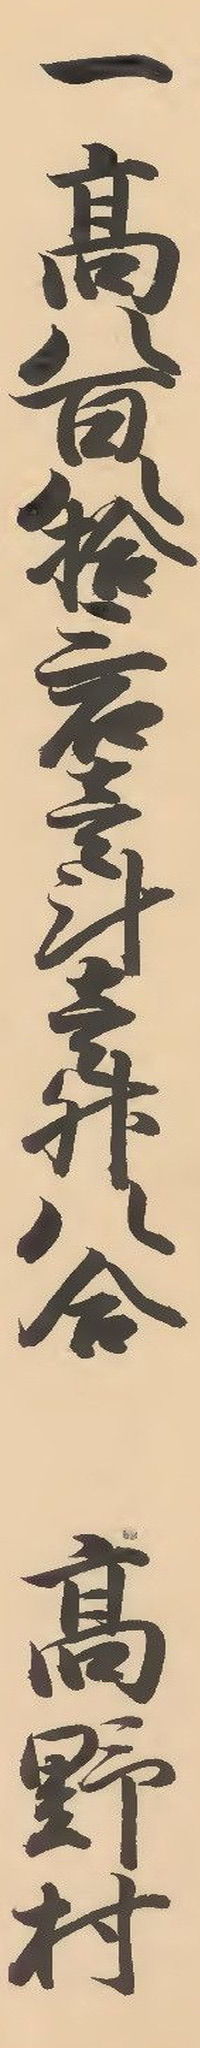一髙八百八拾三石壱斗壱升八合髙野村
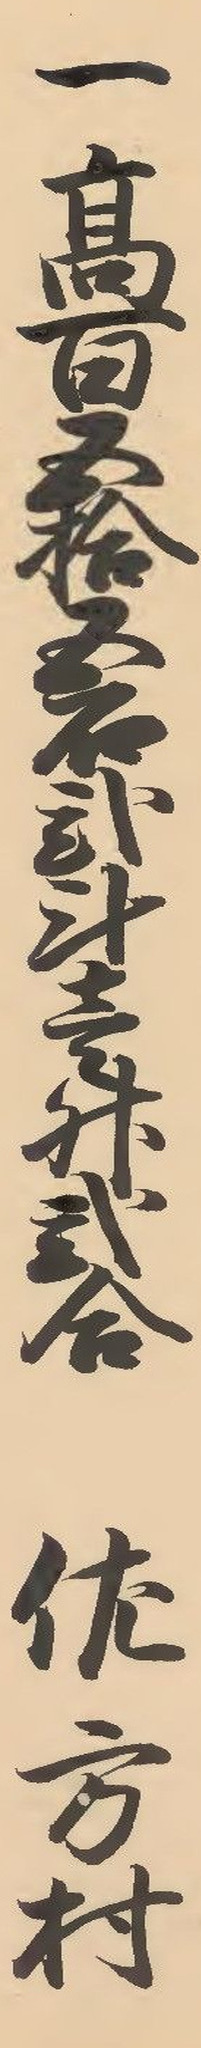一髙百五拾五石弐斗壱升弐合佐方村
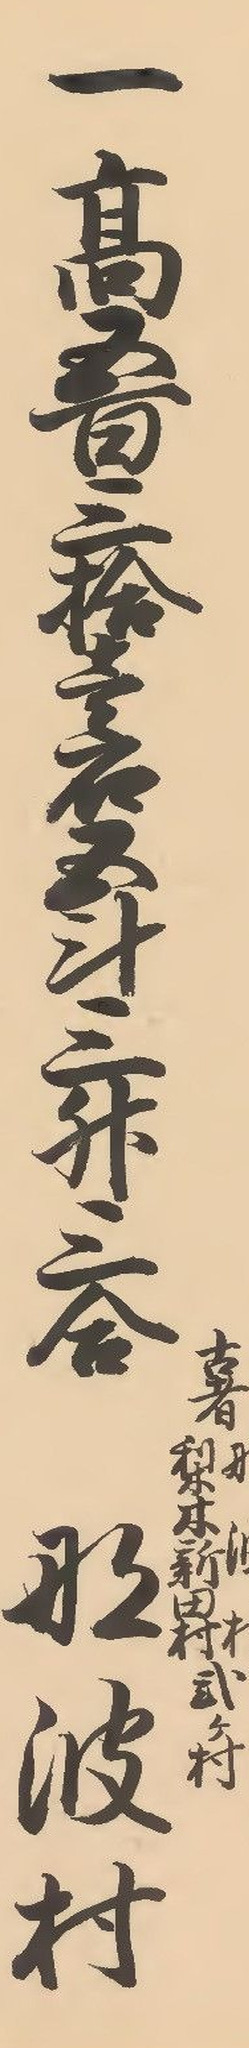一髙五百三拾壱石五斗三升三合那波村
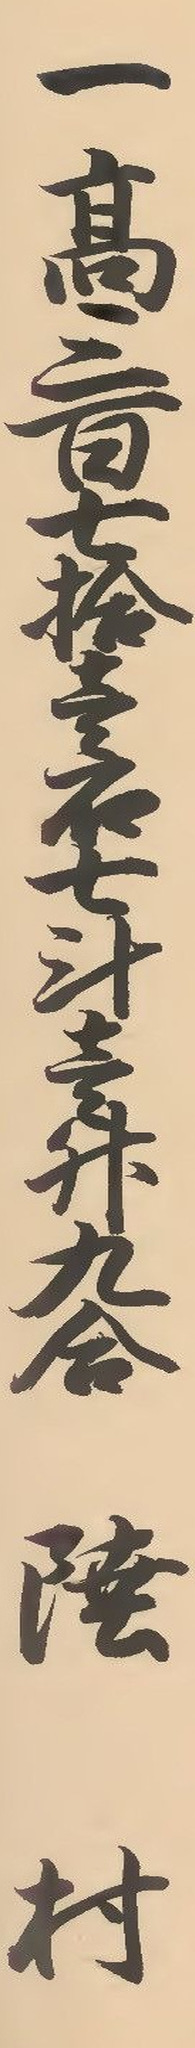一髙三百七拾壱石七斗壱升九合陸村
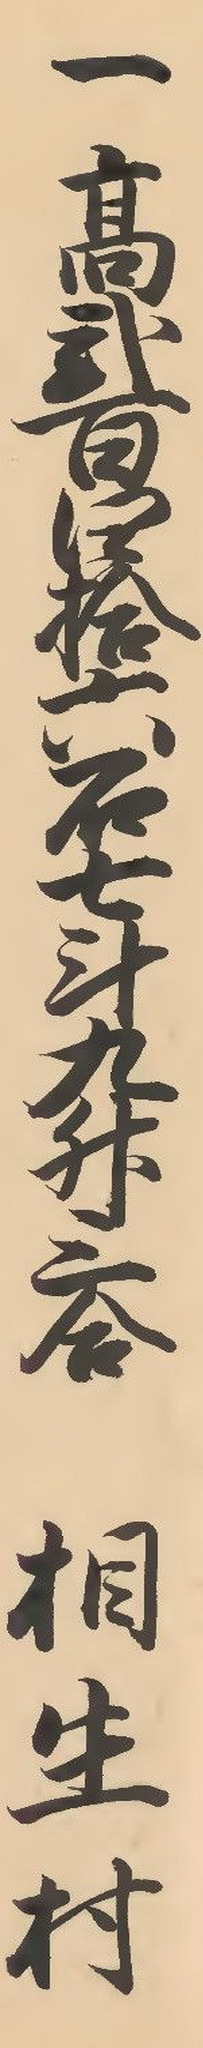一髙弐百四拾六石七斗九升三合相生村
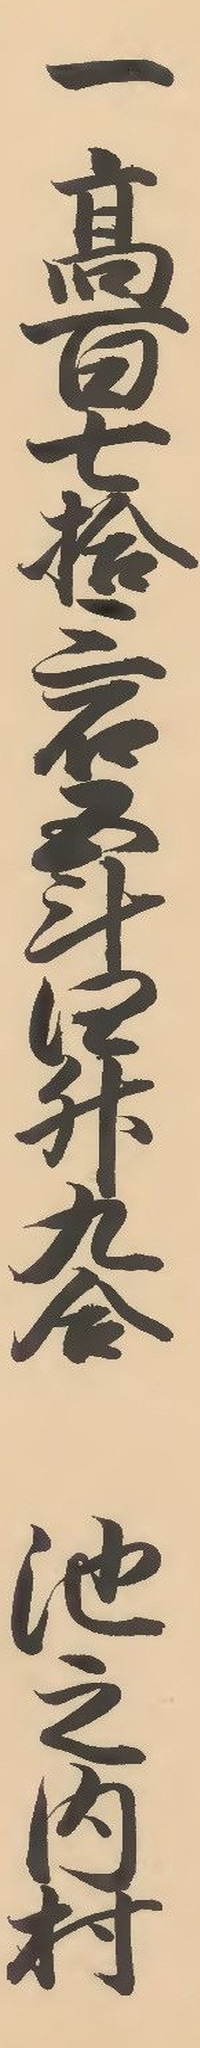一髙百七拾三石五斗四升九合池之内村
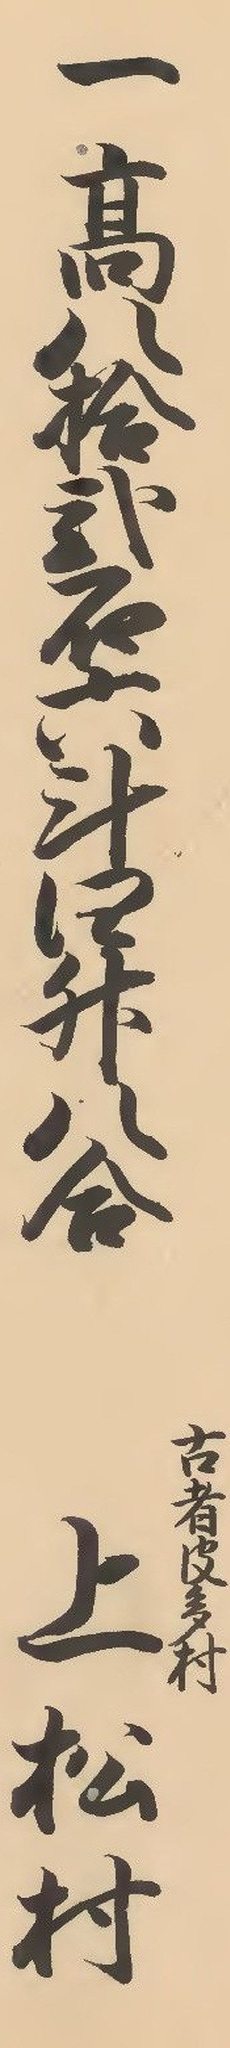一髙八拾弐石六斗四升八合上松村
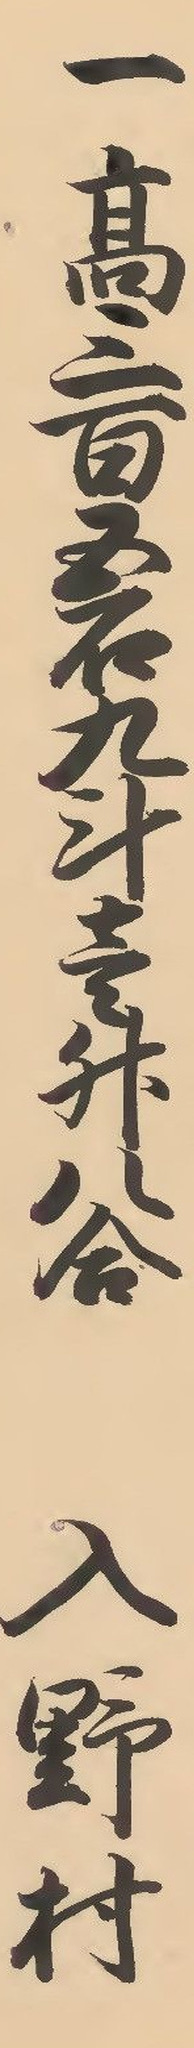一髙三百五石九斗壱升八合入野村

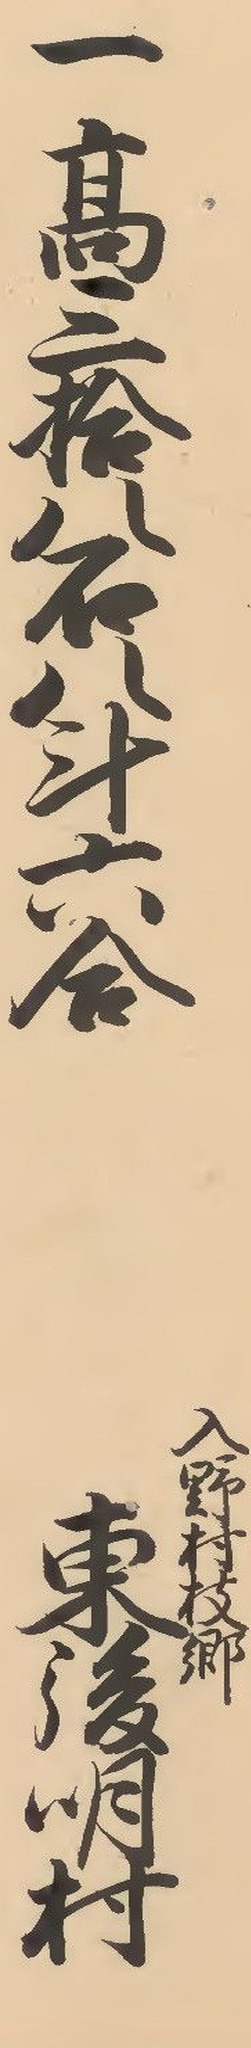一髙三拾八石八斗六合東後明村
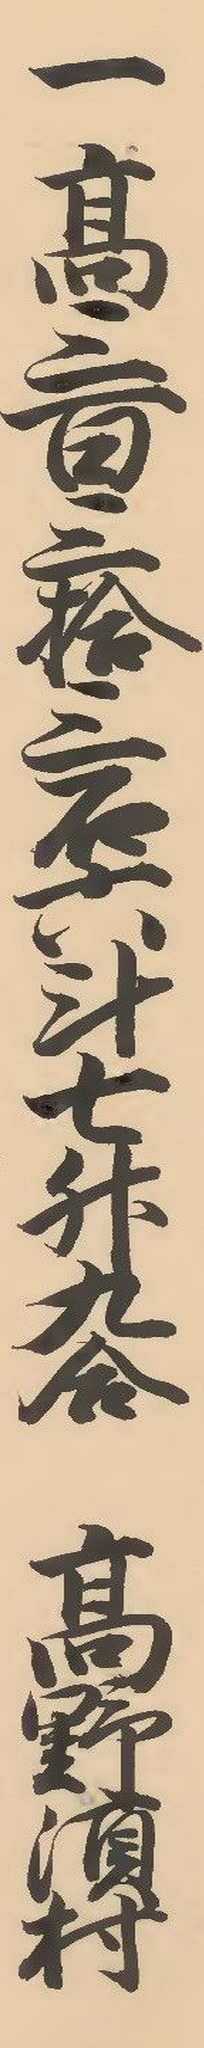一髙三百三拾三石六斗七升九合髙野濱村
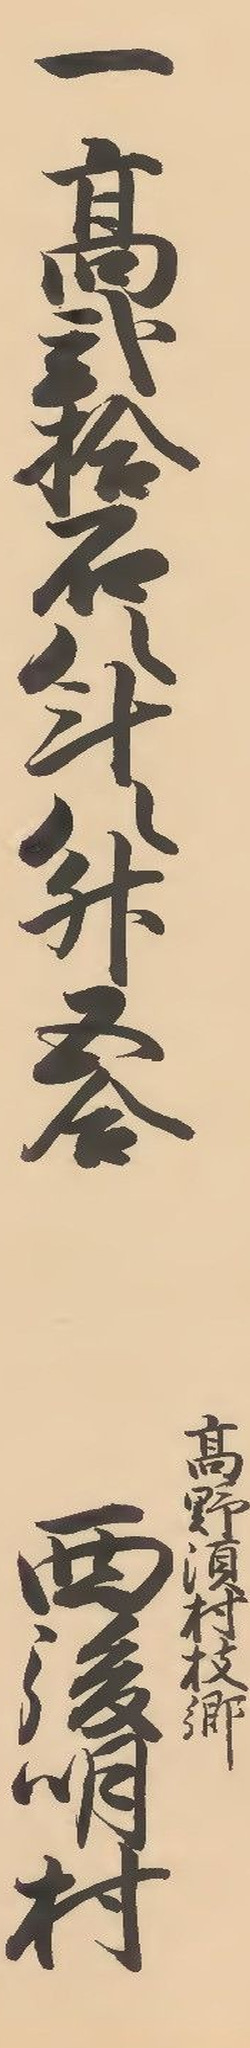一髙弐拾石八斗八升五合西後明村
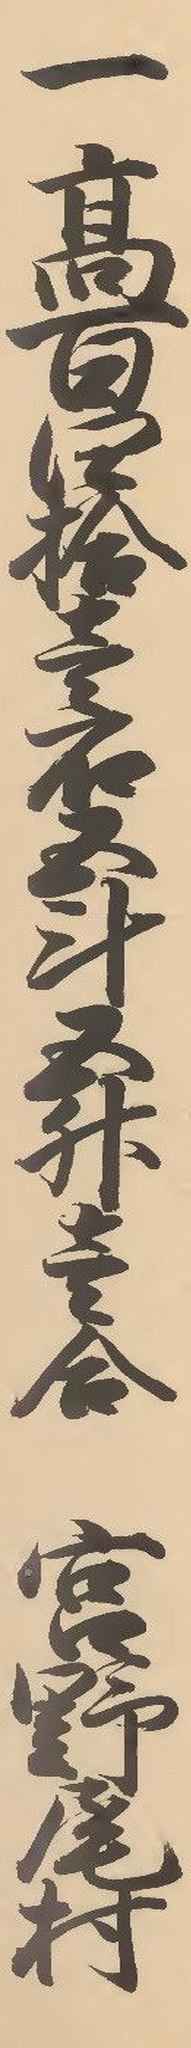一髙百四拾壱石五斗五升壱合宮野尾村
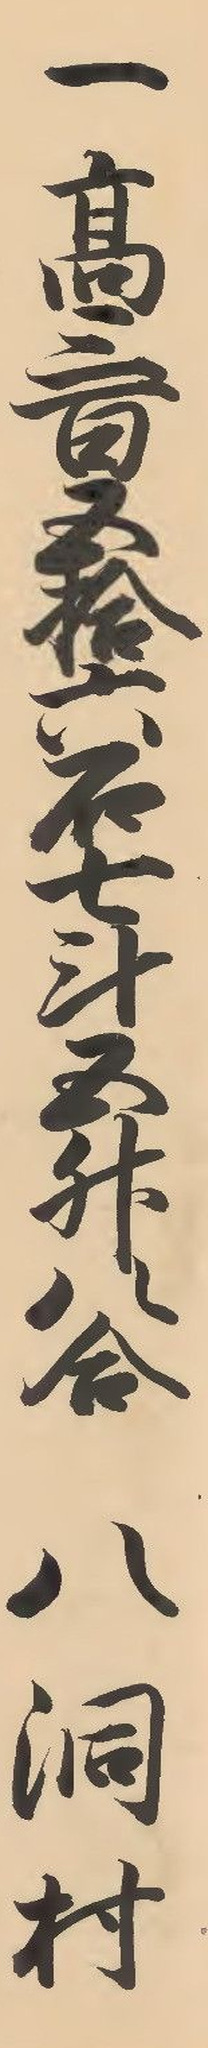一髙三百五拾六石七斗五升八合八洞村
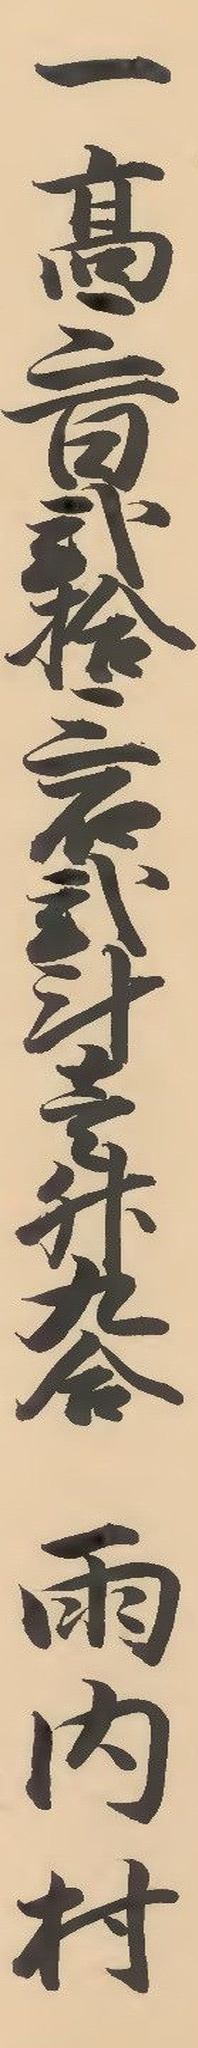一髙三百弐拾三石弐斗壱升九合雨内村
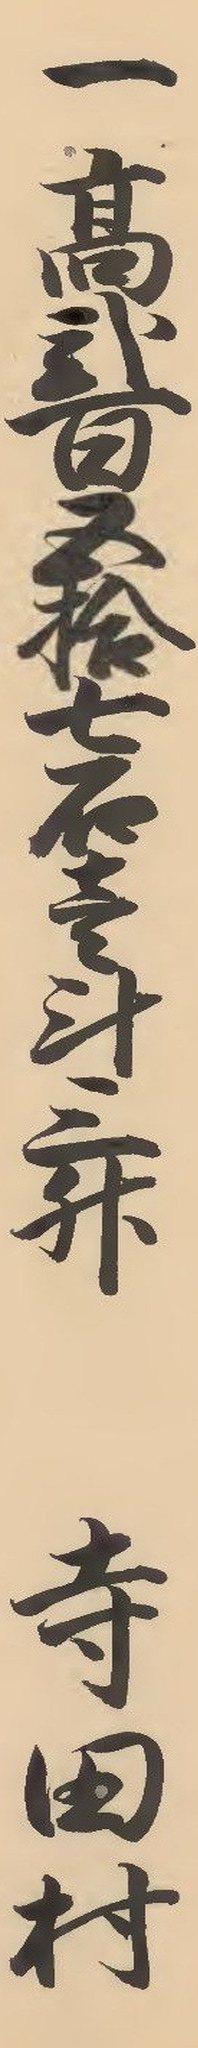一髙弐百五拾七石壱斗三升寺田村
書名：播磨国郷帳
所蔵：国立公文書館 National Archives of Japan
